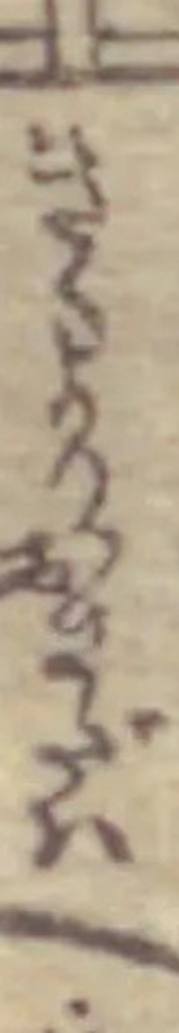きくよりおさだは
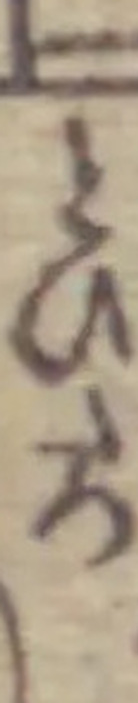とひたつ
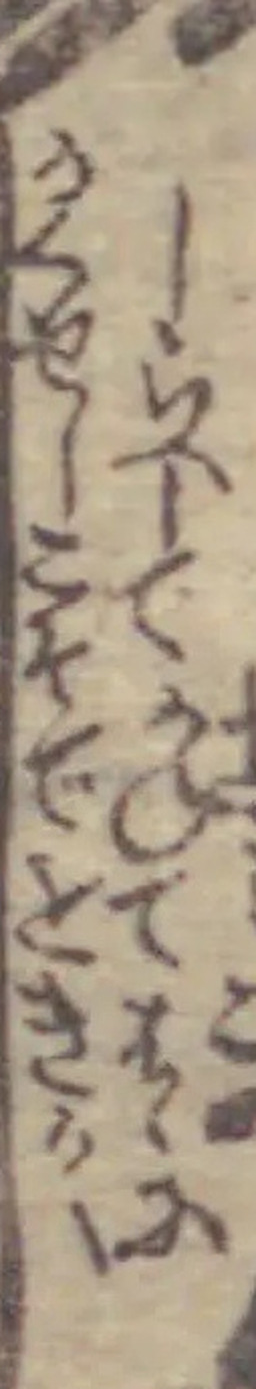かくせしこそでをきかへ
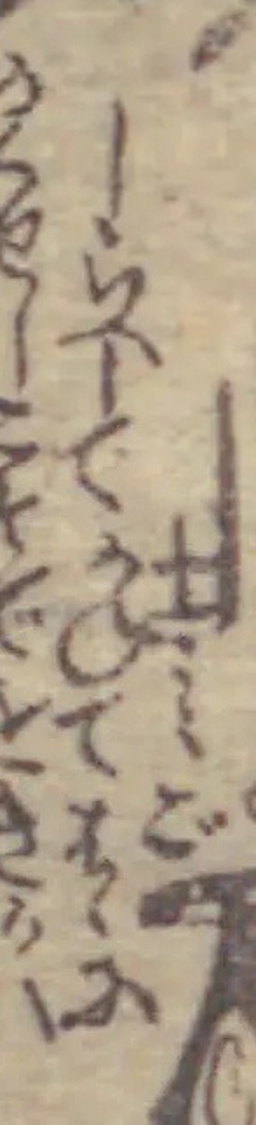しらへしてかねてはゝに
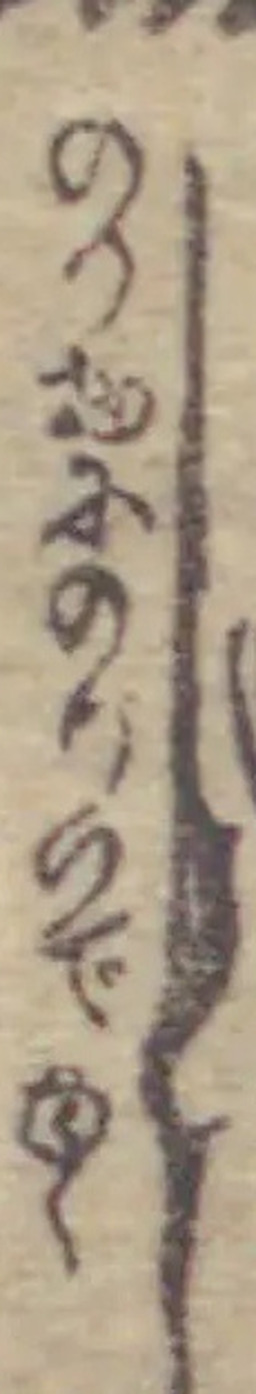のり物にのりいでゆく
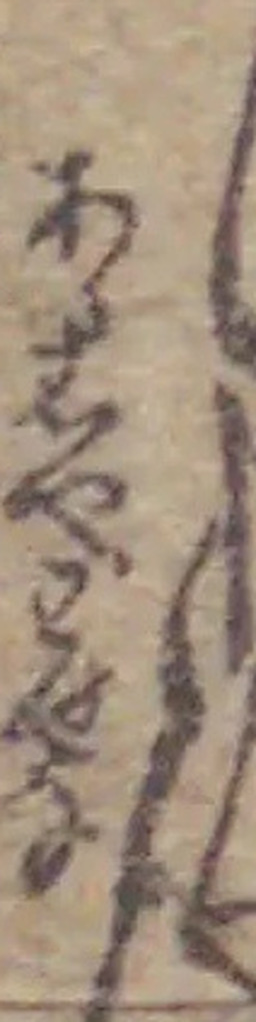あゝしやわせな
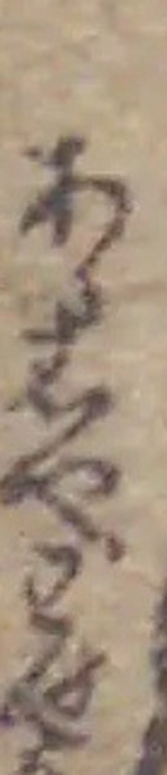あゝしやわせな
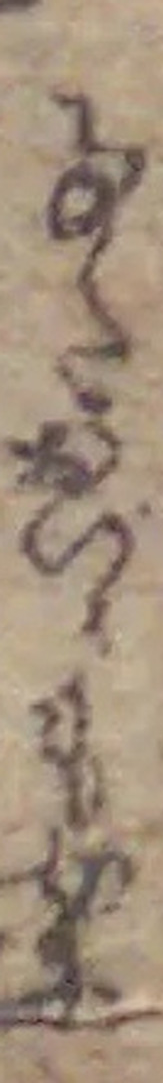事たおいらも女に

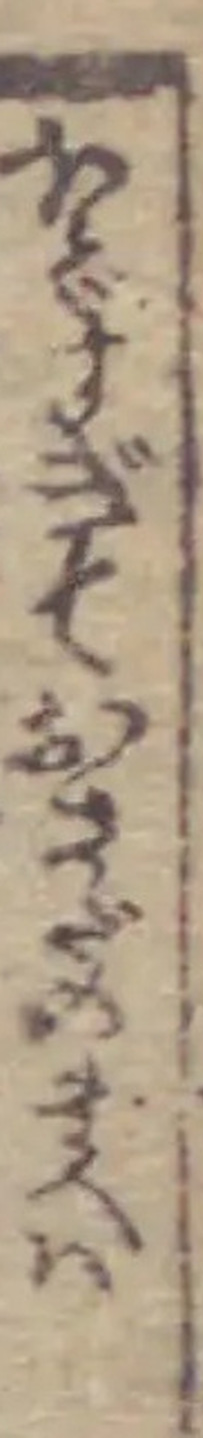ほどすぎておさだのまへは
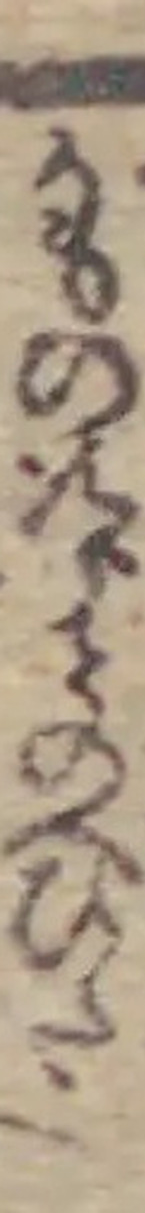かもの次郎とのへひた
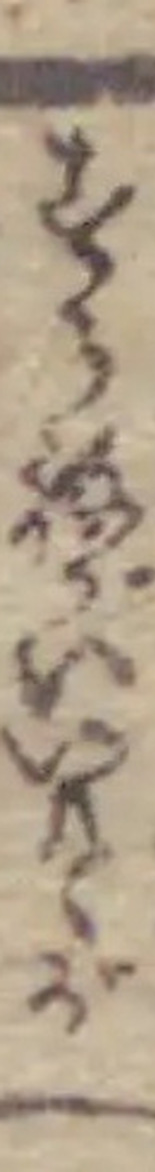すらねがいいもとが
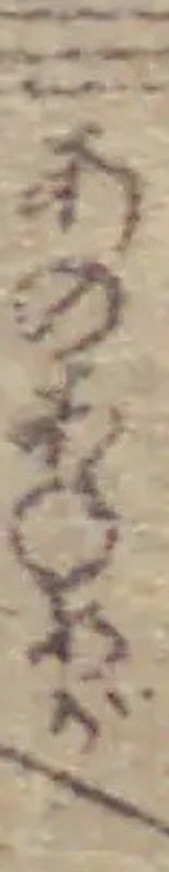あのあねめが
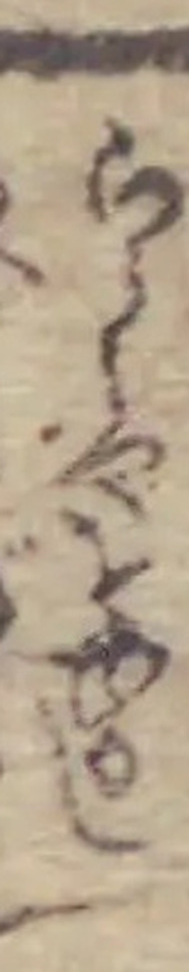らうしやをゆるし
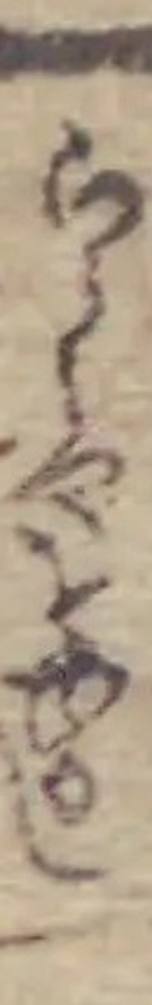らうしやをゆるし
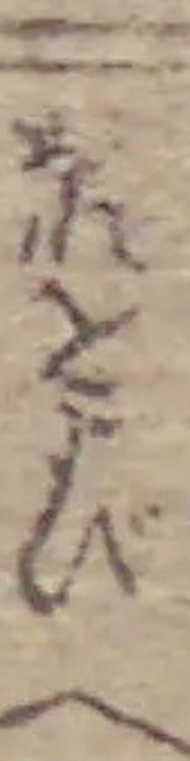おれをよび
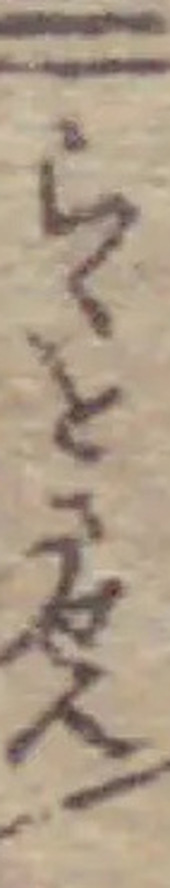らくをさせん
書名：奥州咄 3巻
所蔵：国立国会図書館 National Diet Library, JAPAN
